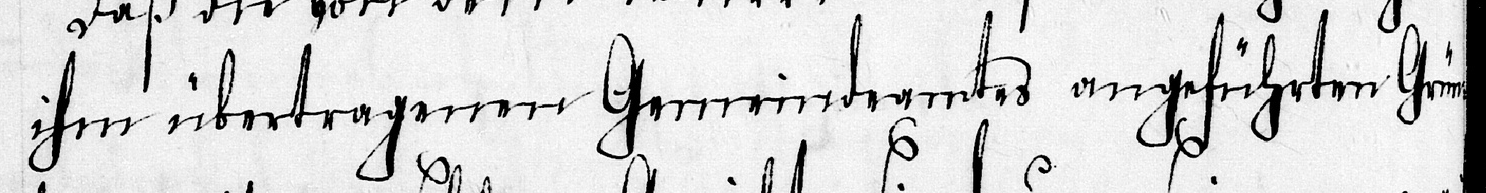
ihm übertragenen Gemeindeamtes angeführten Grü¬
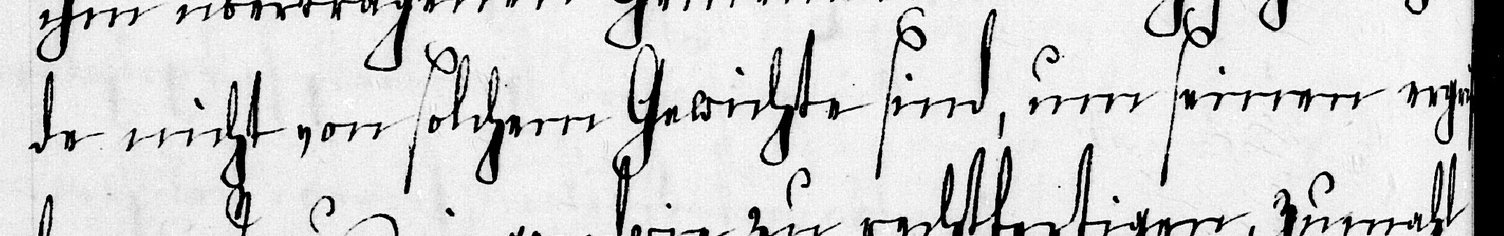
de nicht von solchem Gewichte sind, um seinen erg¬
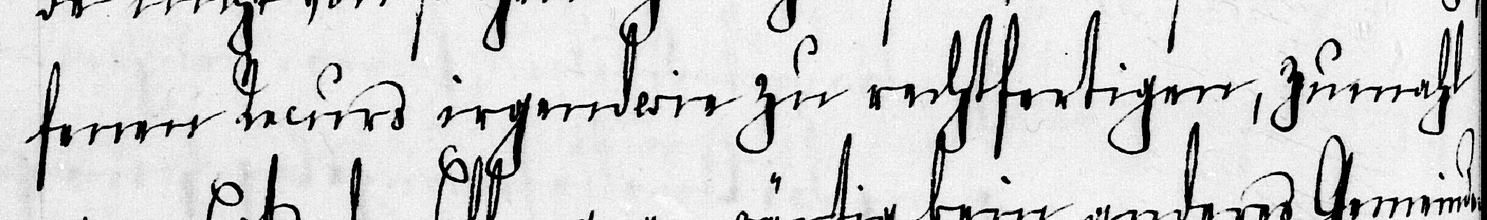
fenen Recurs irgendwie zu rechtfertigen, zumahl
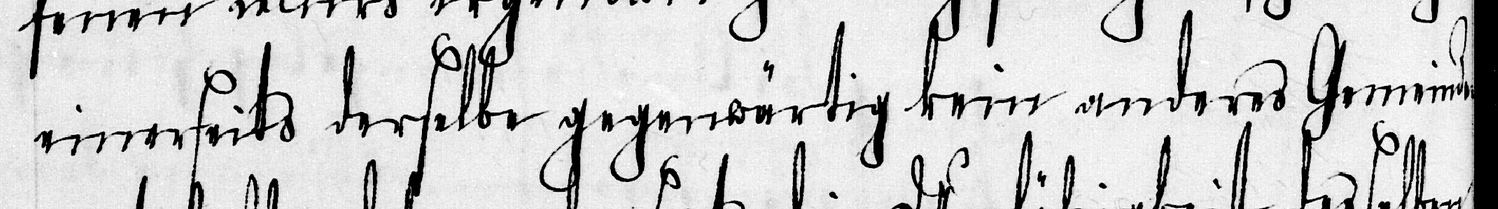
einerseits derselbe gegenwärtig kein anderes Gemein¬
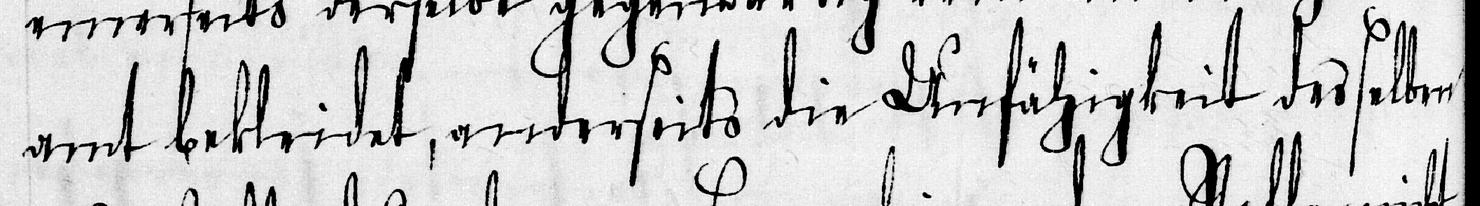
amt bekleidet, anderseits die Unfähigkeit desselben
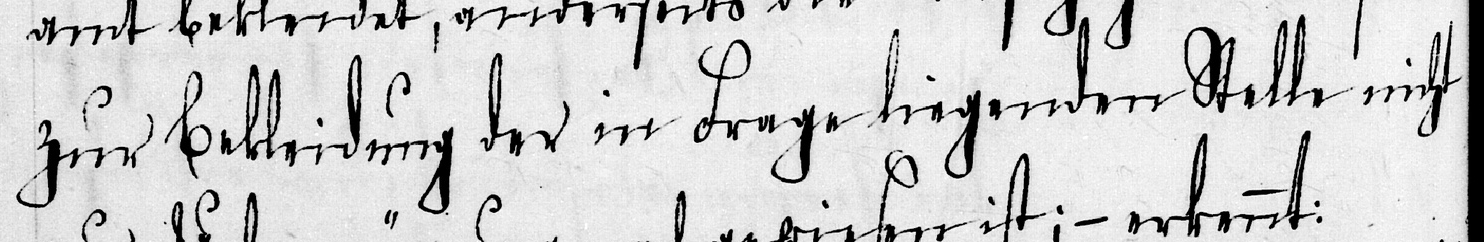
zur Bekleidung der in Frage liegenden Stelle nicht
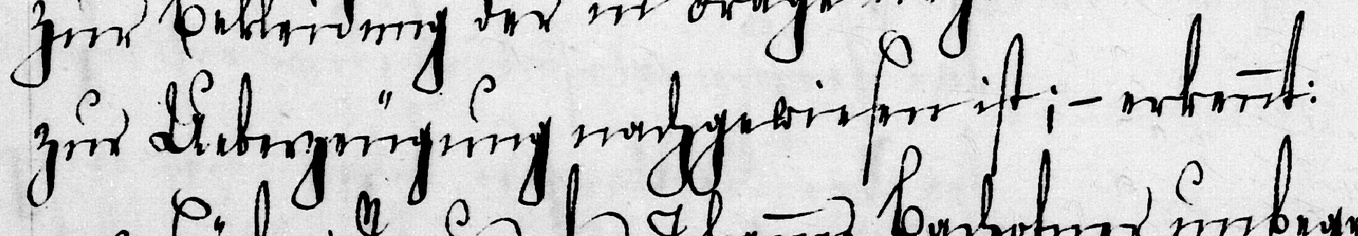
zur Ueberzeugung nachgewiesen ist; – erkennt:
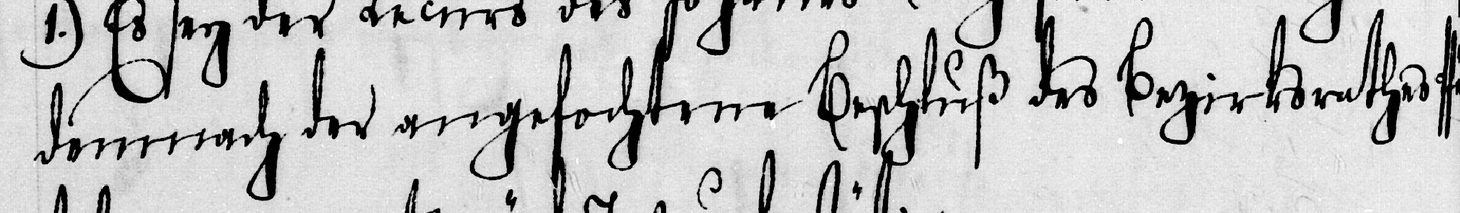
demnach der angefochtene Beschluß des Bezirksrathes
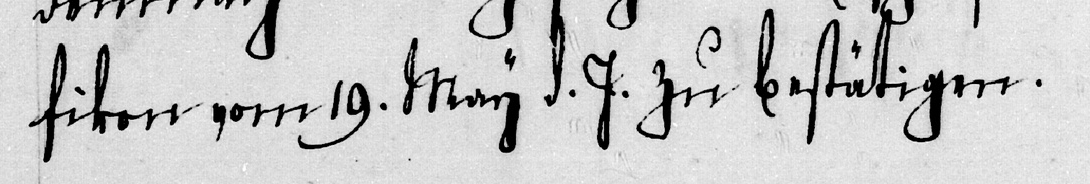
fikon vom 19. May d. J. zu bestätigen.
